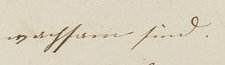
wachsam sind.
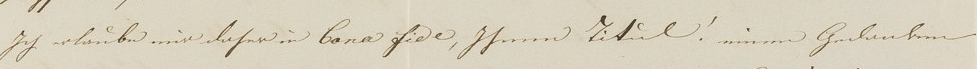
Ich erlaube mir daher in bona fide, Ihnen Titul! einen Gedanken
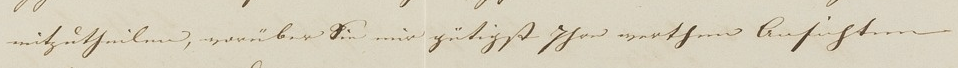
mitzutheilen, worüber Sie mir gütigst Ihre werthen Ansichten
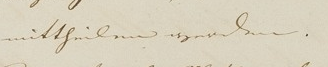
mittheilen werden.
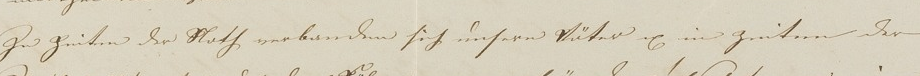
In Zeiten der Noth verbanden sich unsere Väter & in Zeiten der
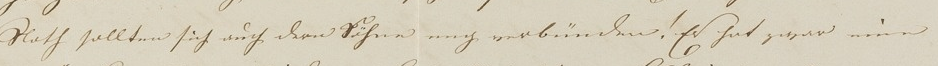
Noth sollten sich auch dern Söhne eng verbünden! Es hat zwar eine
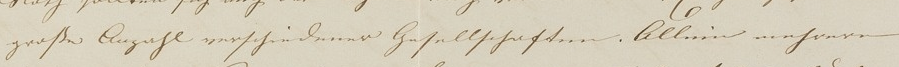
große Anzahl verschiedener Gesellschaften. Allein mehrere
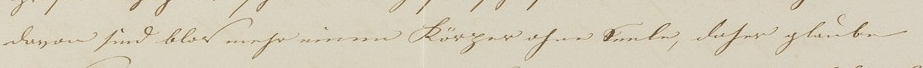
davon sind blos mehr einen Körper ohne Seele, daher glaube
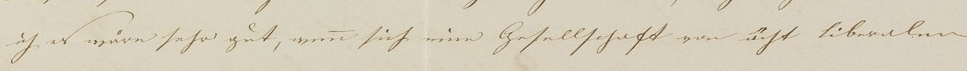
ich es wäre sehr gut, wenn sich eine Gesellschaft von ächt liberalen
